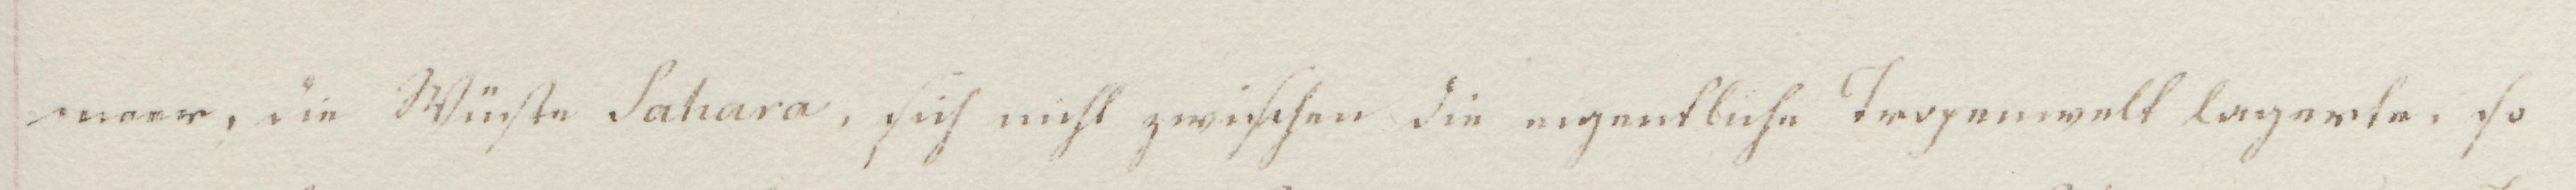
meer, die Wüste Sahara, sich nicht zwischen die eigentliche Tropenwelt lagerte, so
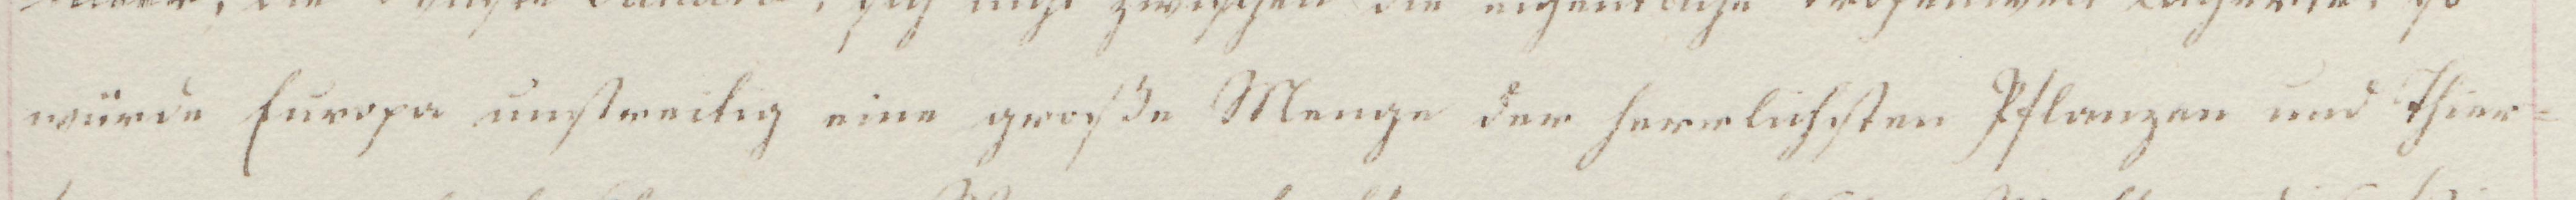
würde Europa unstreitig eine große Menge der herrlichsten Pflanzen und Thier-
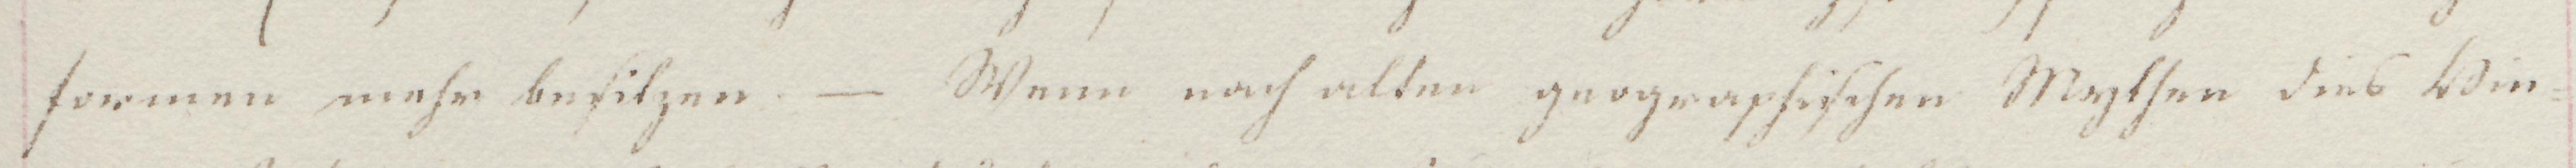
formen mehr besitzen. – Wenn nach alten geographischen Mythen dies Hin-
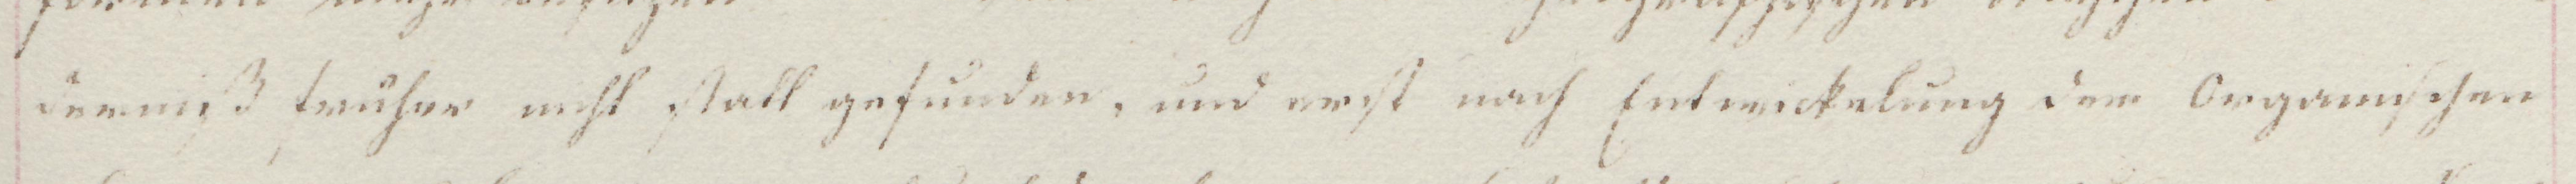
derniß früher nicht statt gefunden, und erst nach Entwickelung der organischen
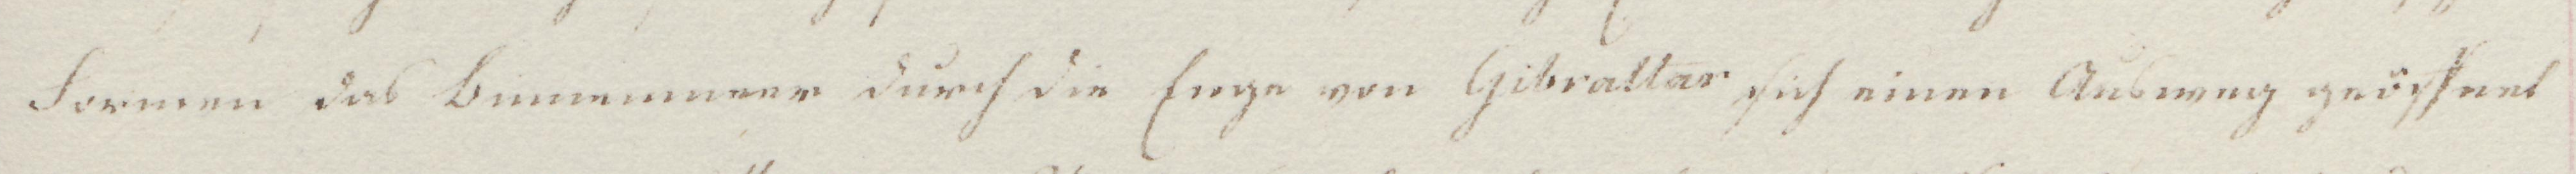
Formen das Binnenmeer durch die Enge von Gibraltar sich einen Ausweg geöffnet
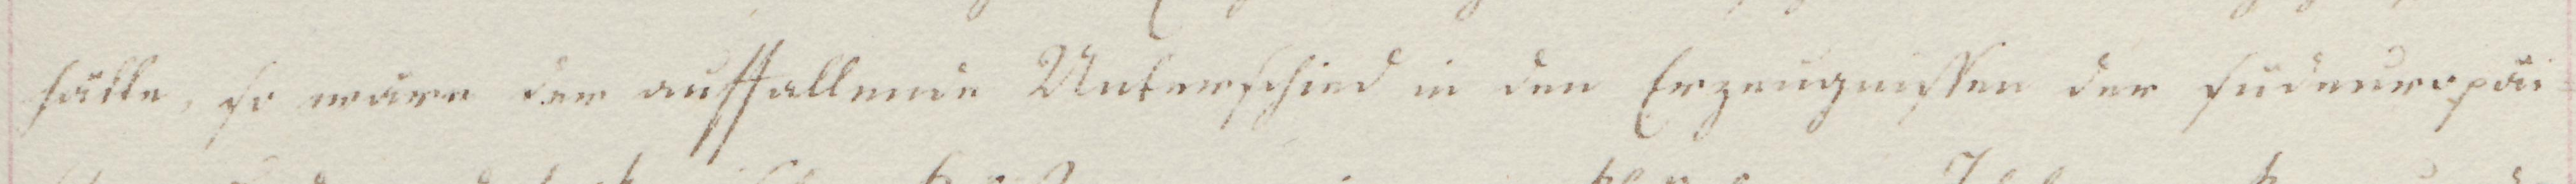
hätte, so wäre der auffallende Unterschied in den Erzeugnissen der südeuropäi-
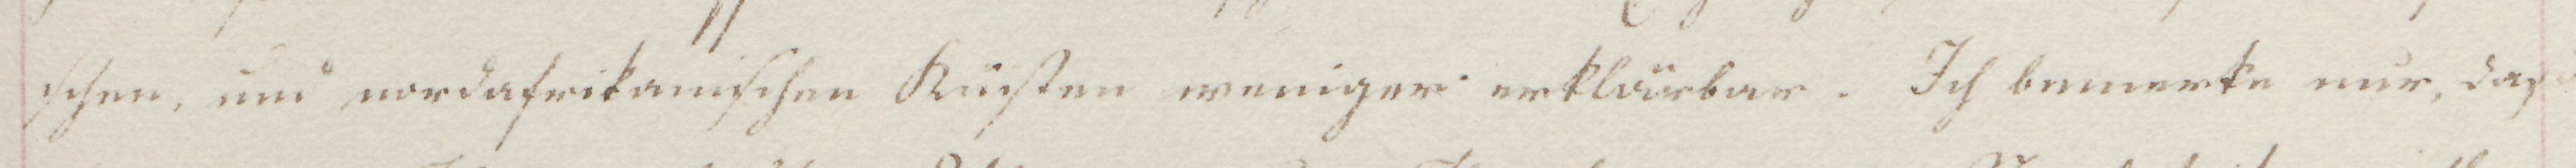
schen, und nordafrikanischen Küsten weniger erklärbar. Ich bemerke nur, daß
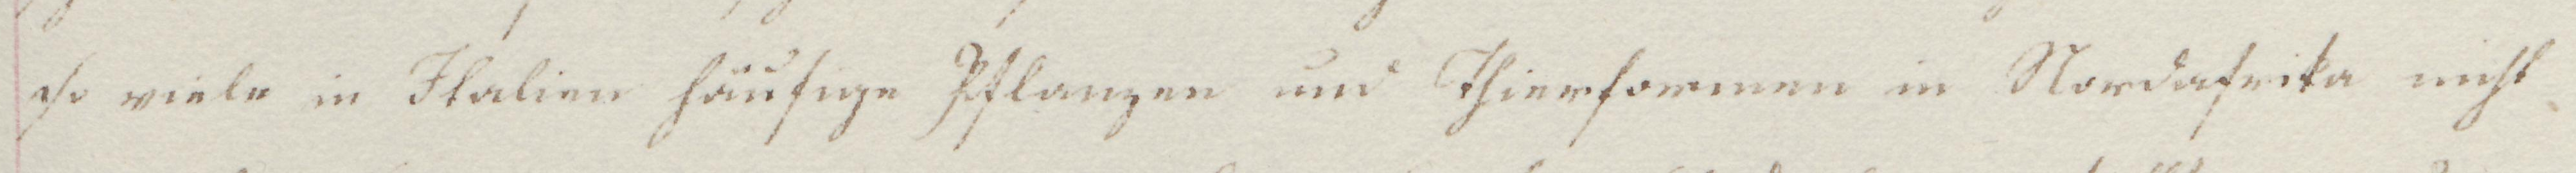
so viele in Italien häufige Pflanzen und Thierformen in Nordafrika nicht
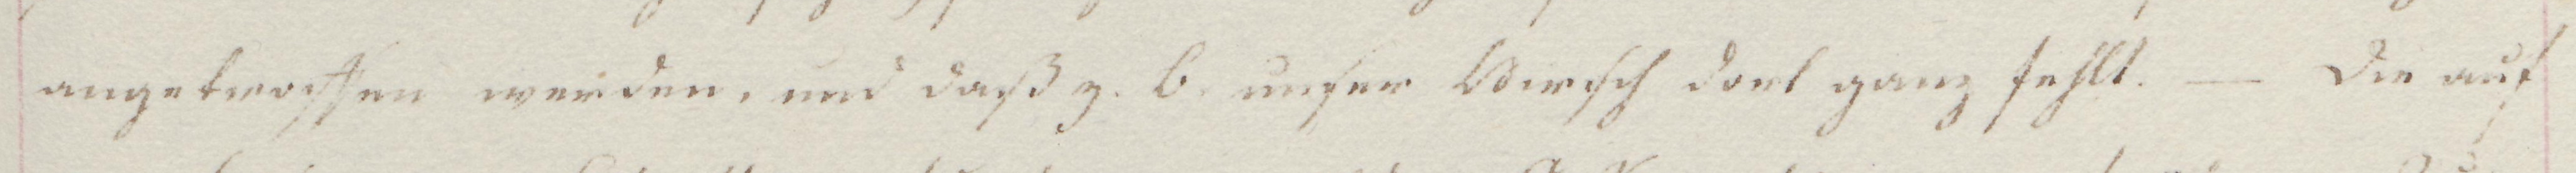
angetroffen werden, und daß z. B. unser Hirsch dort ganz fehlt. – Die auf
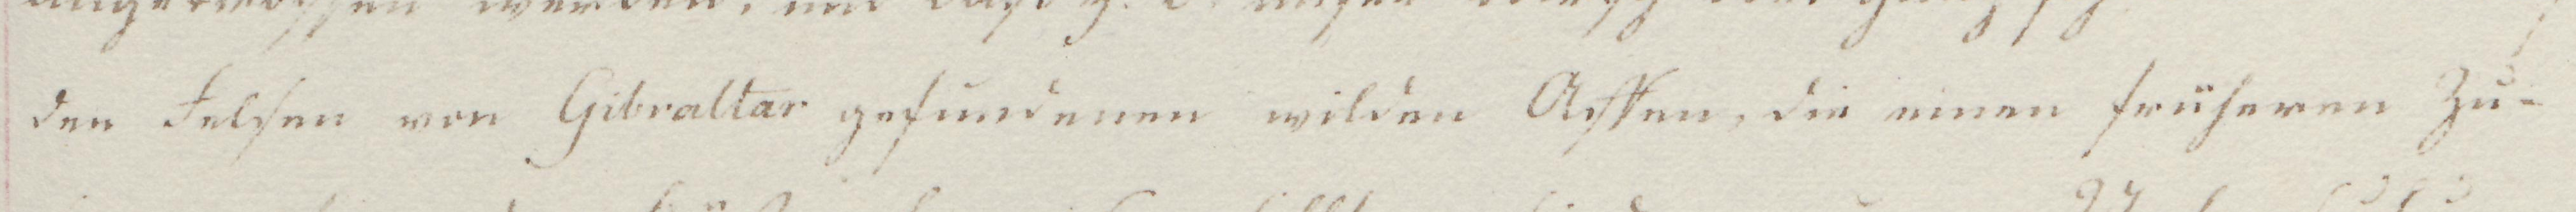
den Felsen von Gibraltar gefundenen wilden Affen, die einen früheren Zu-
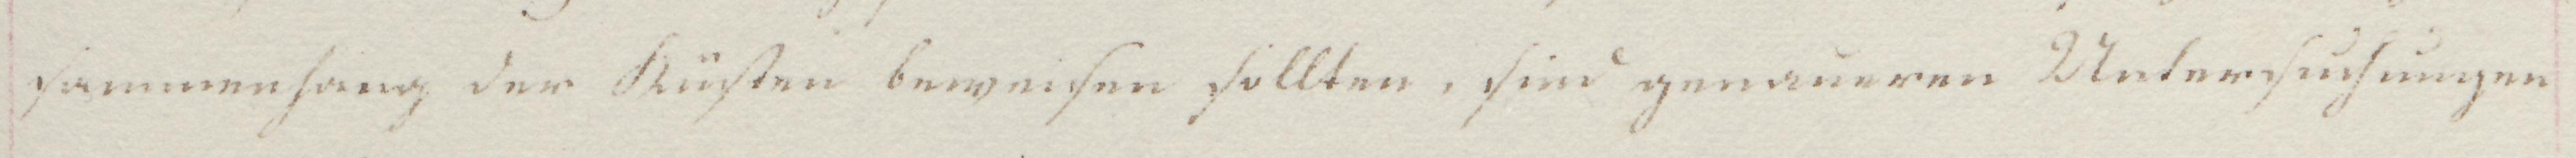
sammenhang der Küsten beweisen sollten, sind genaueren Untersuchungen
